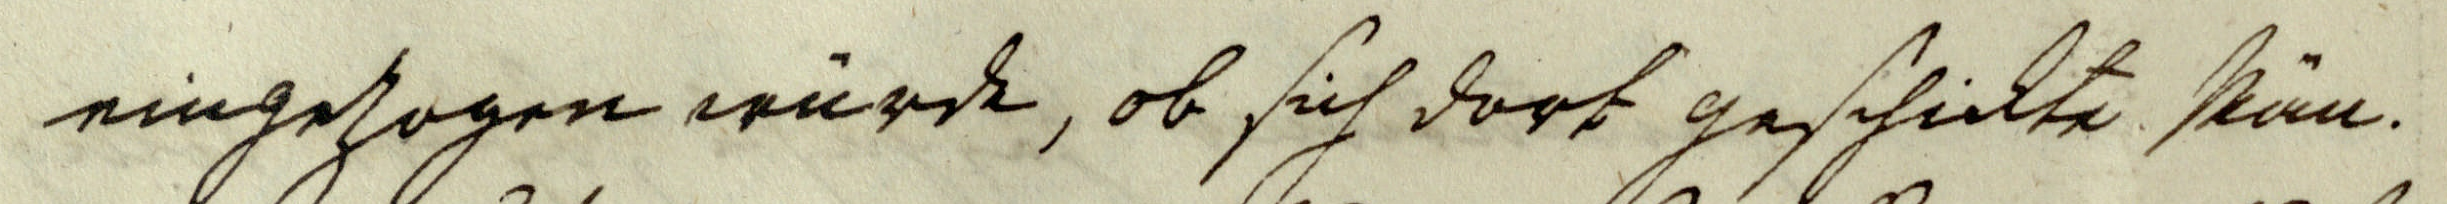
eingezogen würde, ob sich dort geschickte Män¬
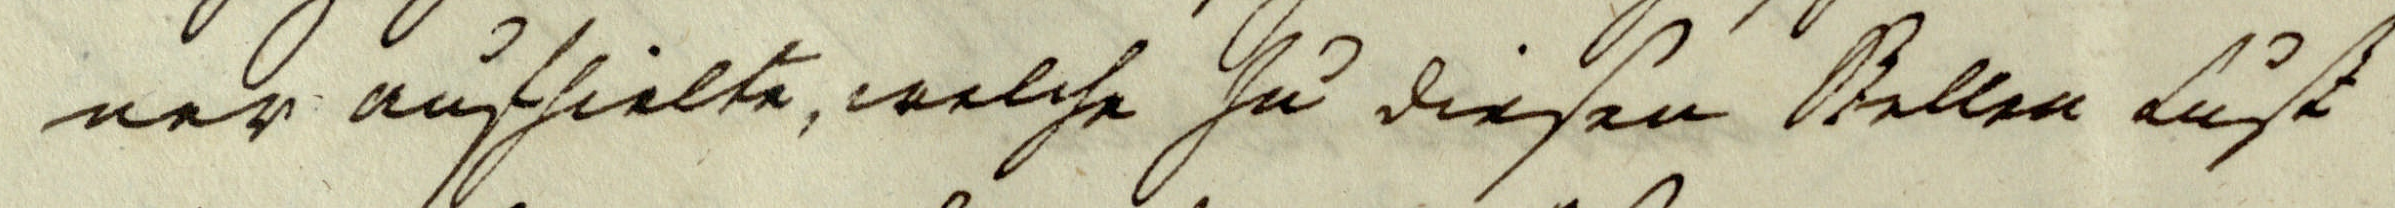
ner aufhielten, welche zu diesen Stellen Lust
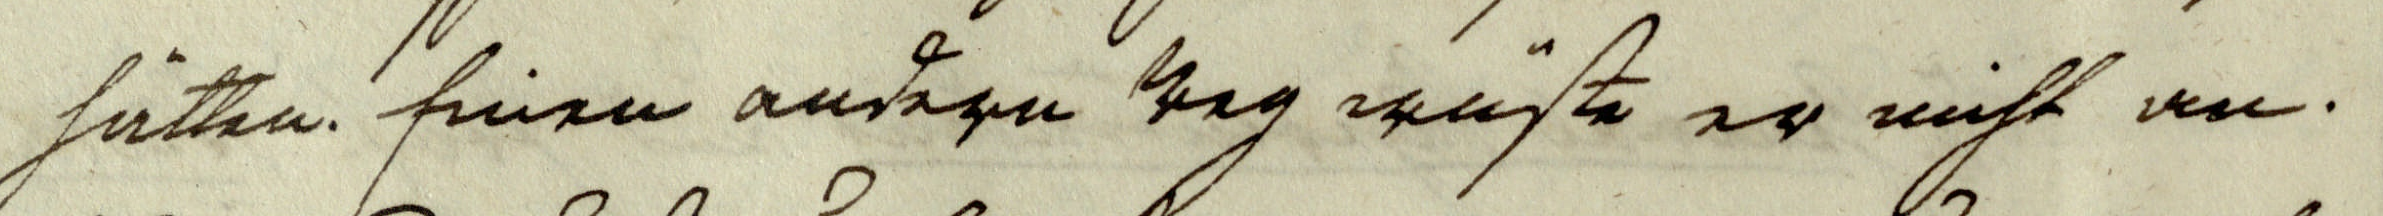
hätten. Einen andern Weg wüßte er nicht an¬
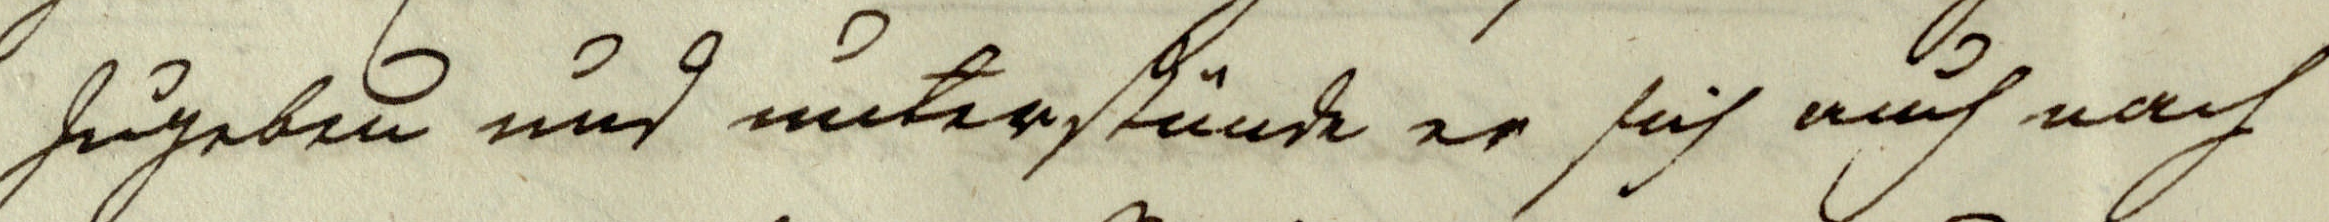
zugeben und unterstünde er sich auch nach
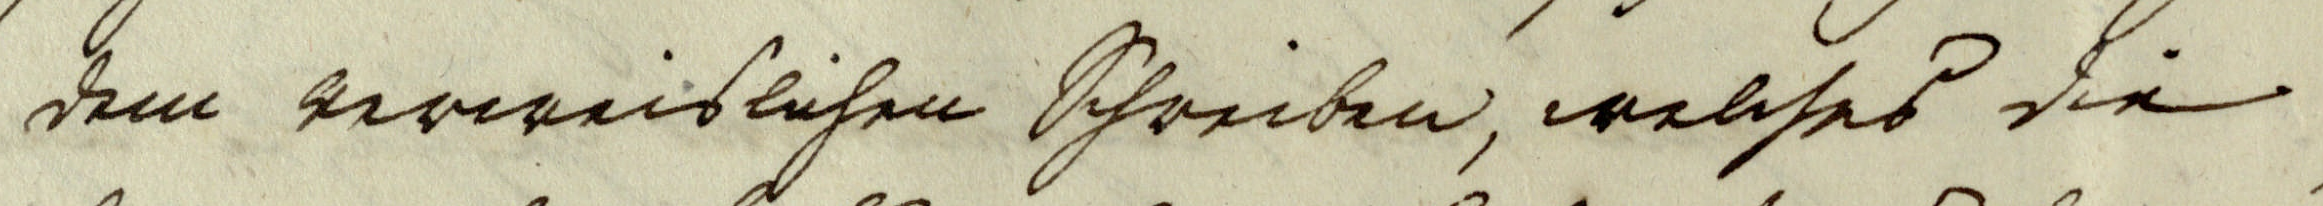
dem verweislichen Schreiben, welches die
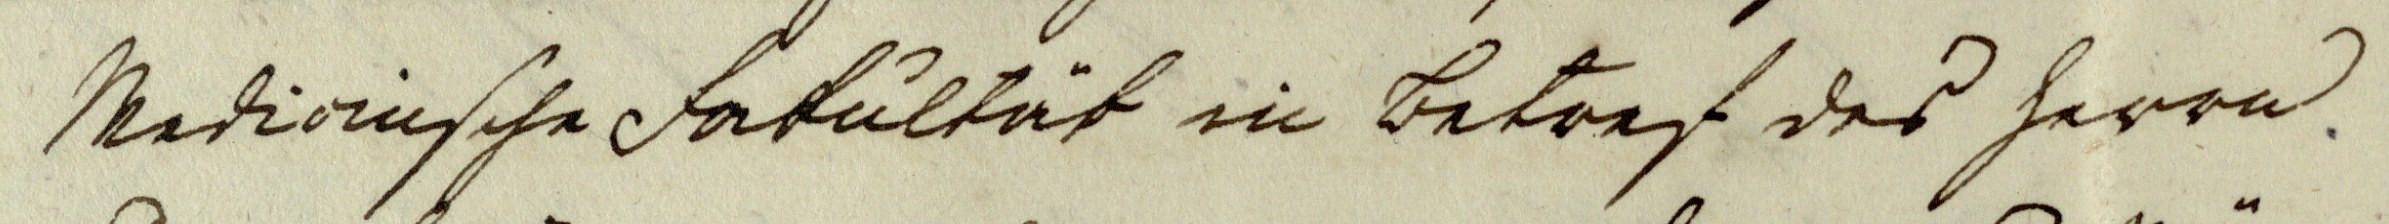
Medicinische Fakultät in Betref des Herrn
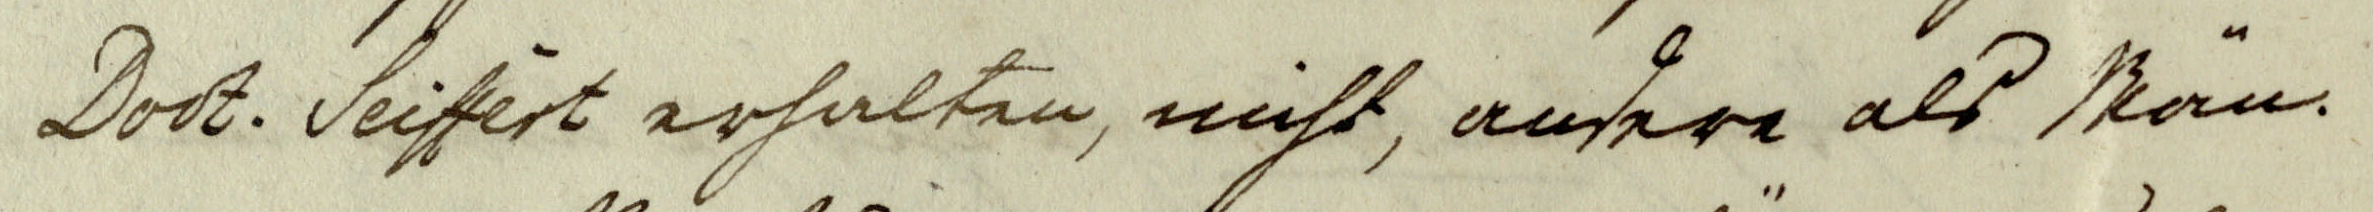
Doct. Seiffert erhalten, nicht, andere als Män¬
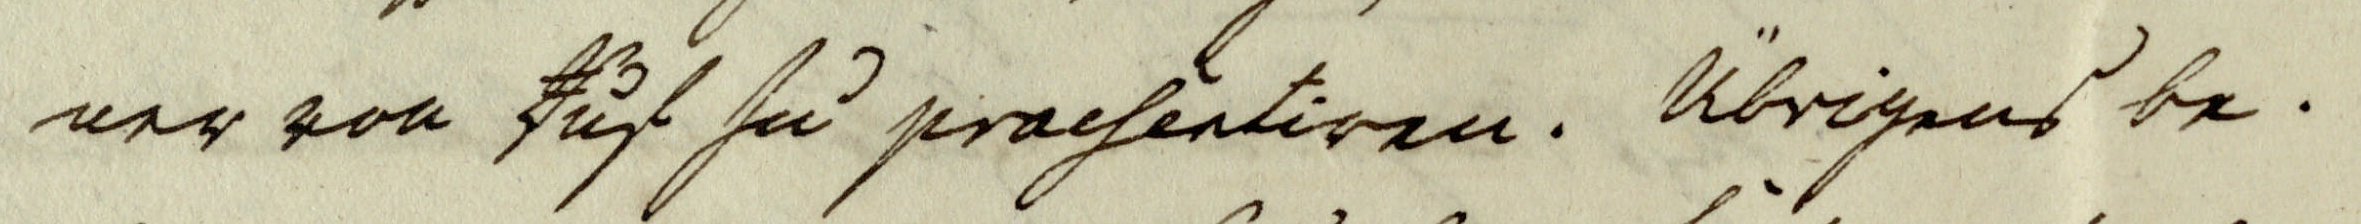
ner von Ruf zu praesentiren. Übrigens be¬
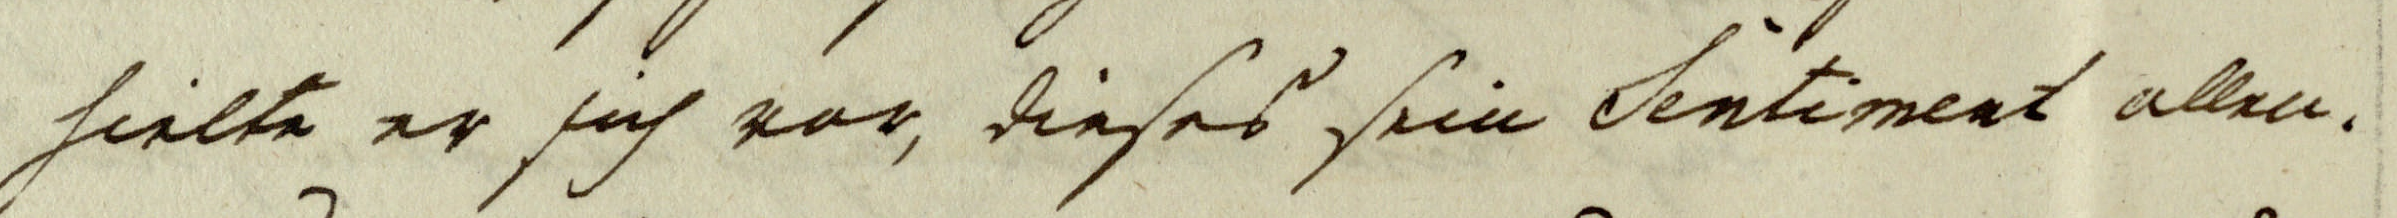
hielte er sich vor, dieses sein Sentiment allen¬
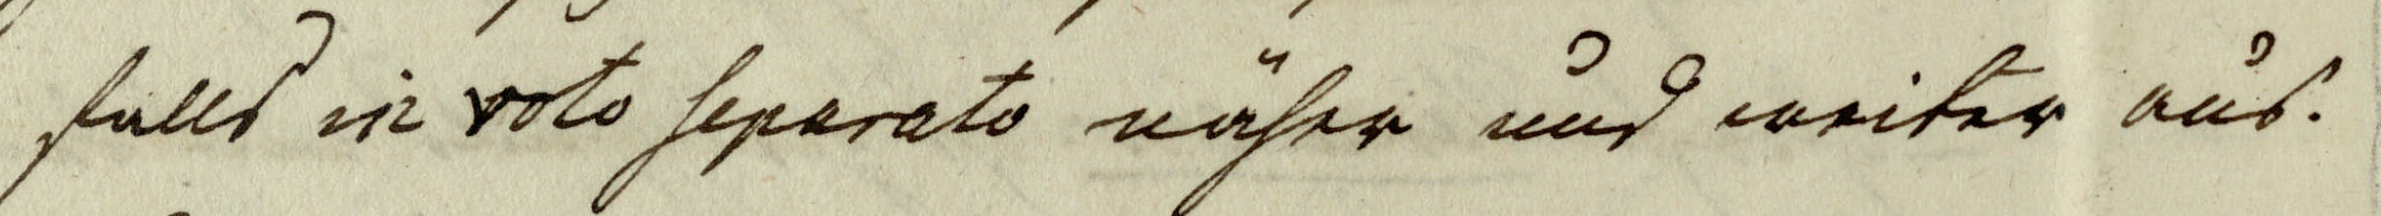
falls in voto separato näher und weiter aus¬
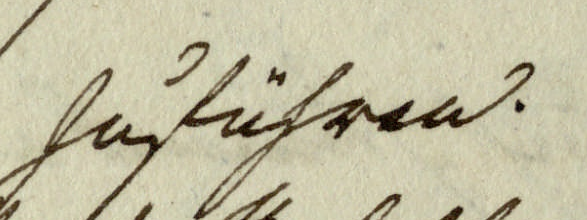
zuführen.
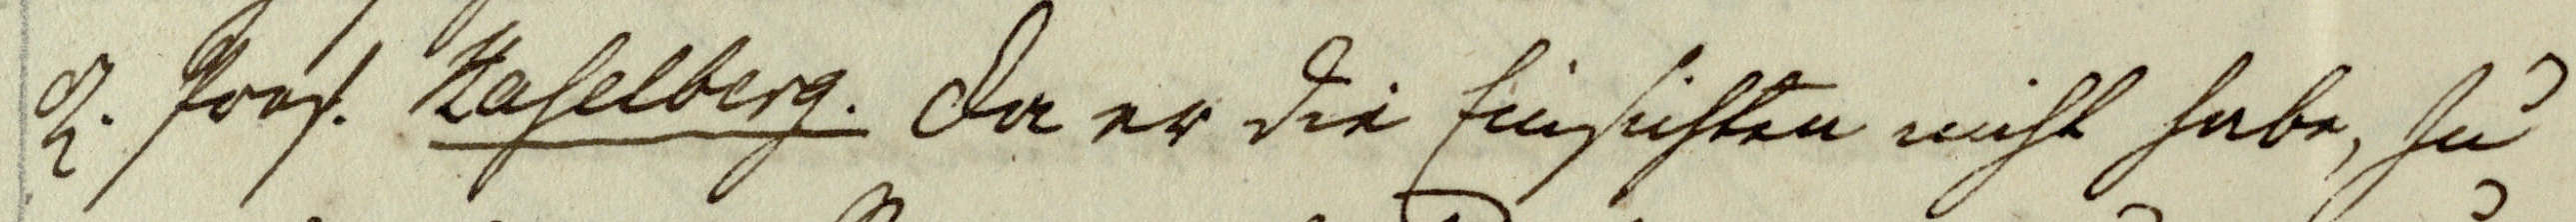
dh. Prof. Haselberg. Da er die Einsichten nicht habe, zu
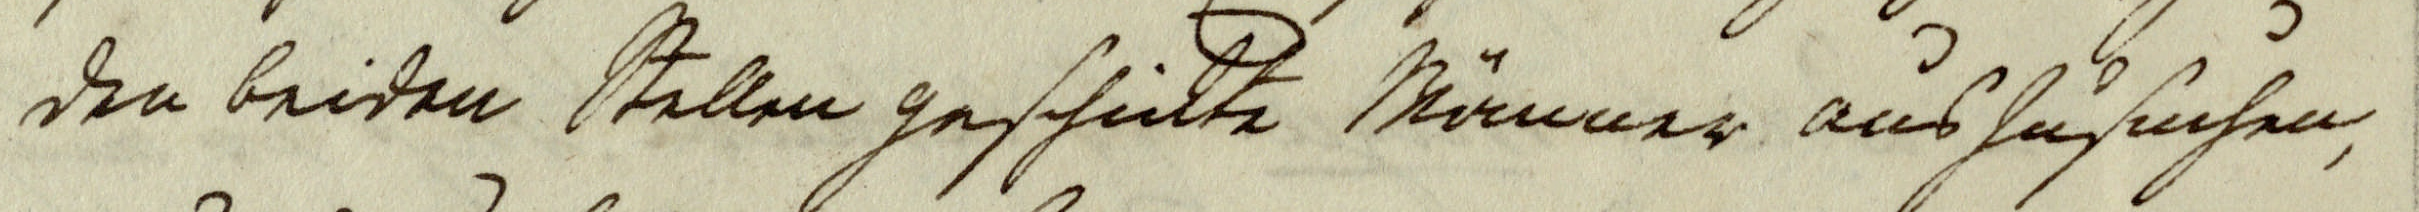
den beiden Stellen geschickte Männer auszusuchen,
